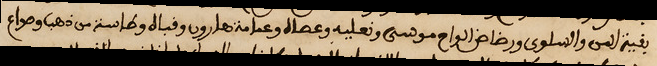بقية المن والسلوى ورضاض الواح موسى ونعليه وعصاه وعمامة هارون وقباه وطاسة من ذهب وصواع
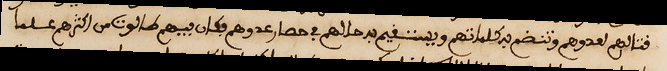قتالهم لعدوهم تنضم به كلماتهم ويستقيم به حالهم في حصار عدوهم فكان فيهم طالوت من اكثرهم علما
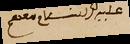عليه السلام معهم
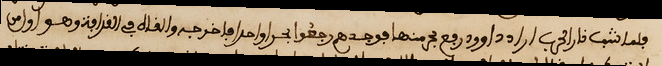فلما شبت نار الحرب اراد داوود رفع بحر منها فوجدهم رجعوا بحرا واحدا فاخرجه والقاه في القدافة وهو اول من
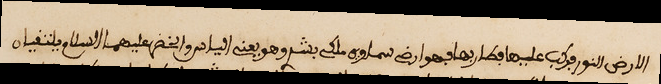الارض النور فركب عليها فطار بها فهو ارضى سماوي ملكى بشرى وهو يعنى الياس والخضر عليهما السلام يلتقيان
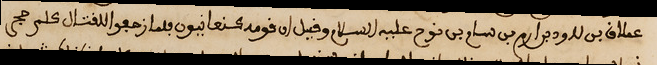عملاق بن لاود بن ارم بن سام بن نوح عليه والسلام وقيل ان قومه كنعانيون فلما زجعوا للقتال كلم حجر
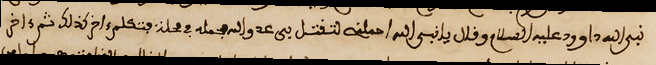نبى الله داوود عليه السلام وقال يا نبى الله احملنى لتقتل بى عدو الله فحمله في محلة فتكلم ءاخر كذلك ثم ءاخر
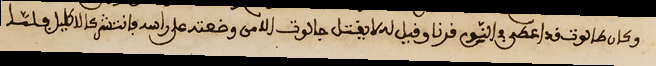كان طالوت قد اعطى في النوم قرنا وقيل له لا يقتل جالوت الامن وضعته على واسه فانتشر كالاكليل فلما
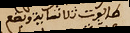طالوت ثلاثماية ويضع
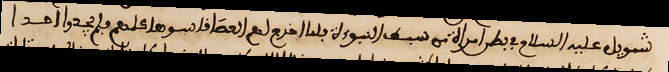شمويل عليه السلام في بطن امراة من سبط النبوءة فلما اخرج لهم العصا قاسوها كلهم فلم يجدوا احدا
